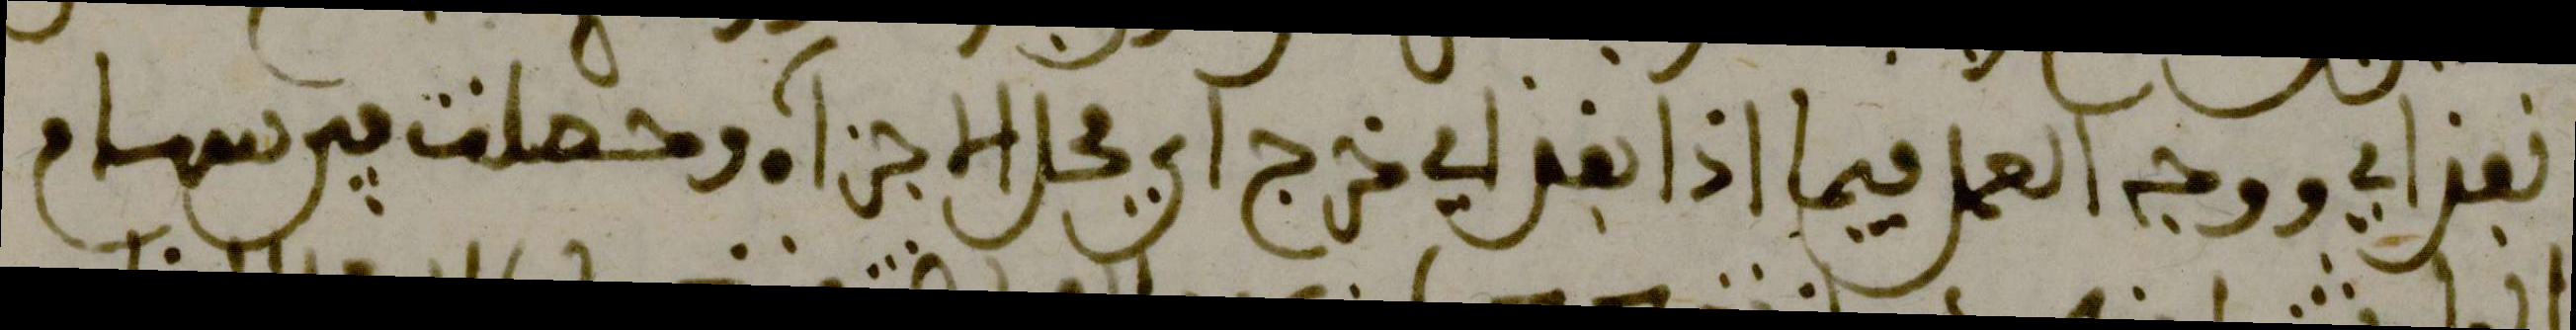نفذ اي ووجه العمل فيما اذا نفذ اي خرج اي محل الاجزاء وحصلت في سهام
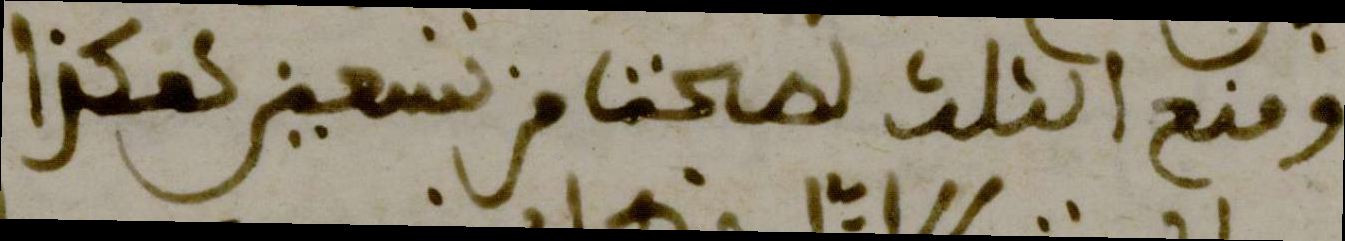ومنع الثلث لصحت من تسعين هكذا
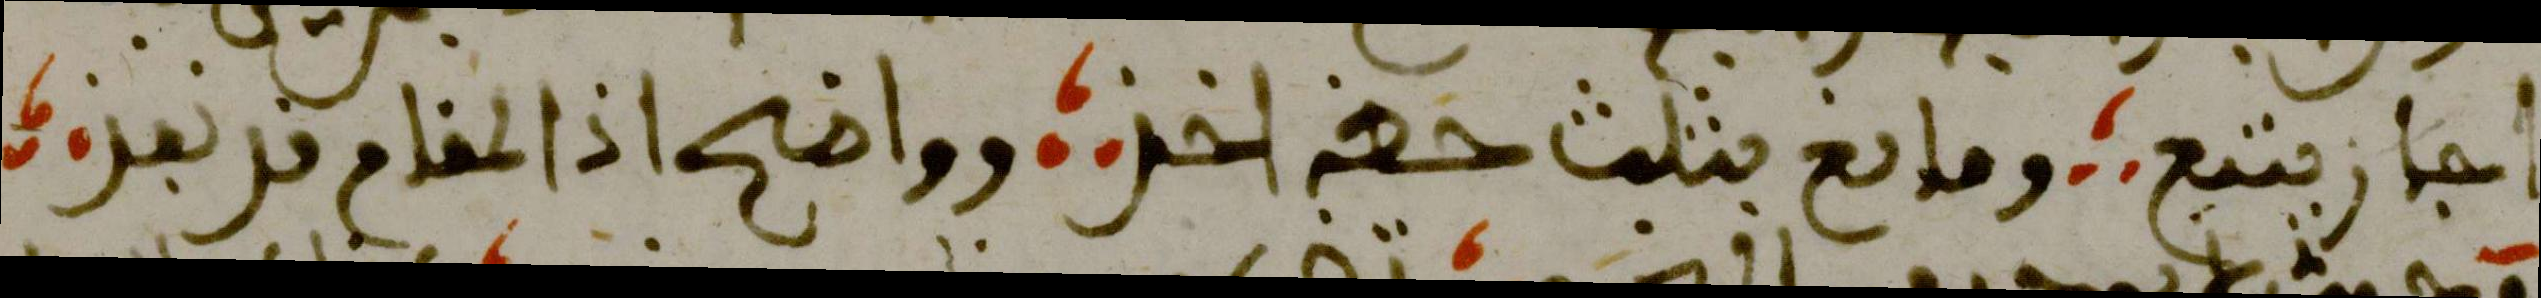اجاز يتبع ومانع بثلث حظه اخذ وواضح اذ المقام قد نفذ
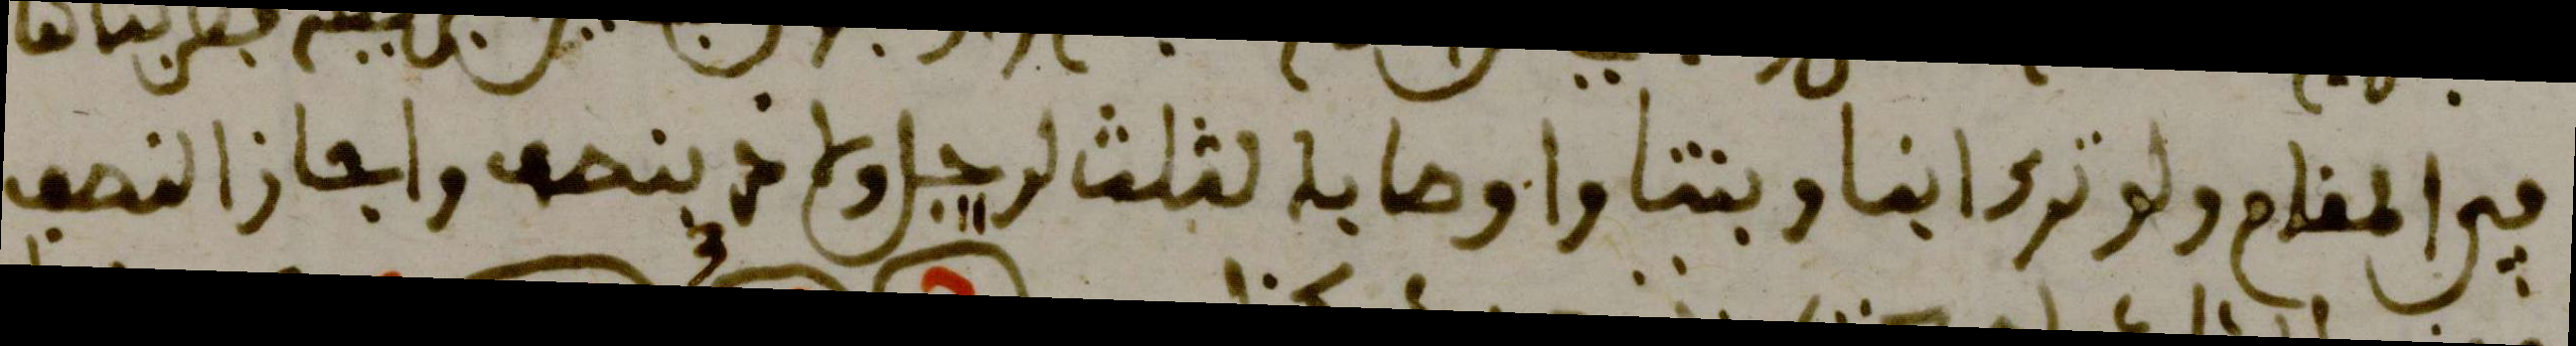في المقام ولو ترك ابنا وبنتا واوصا بالثلث لرجل ولاخر بنصف واجاز النصف
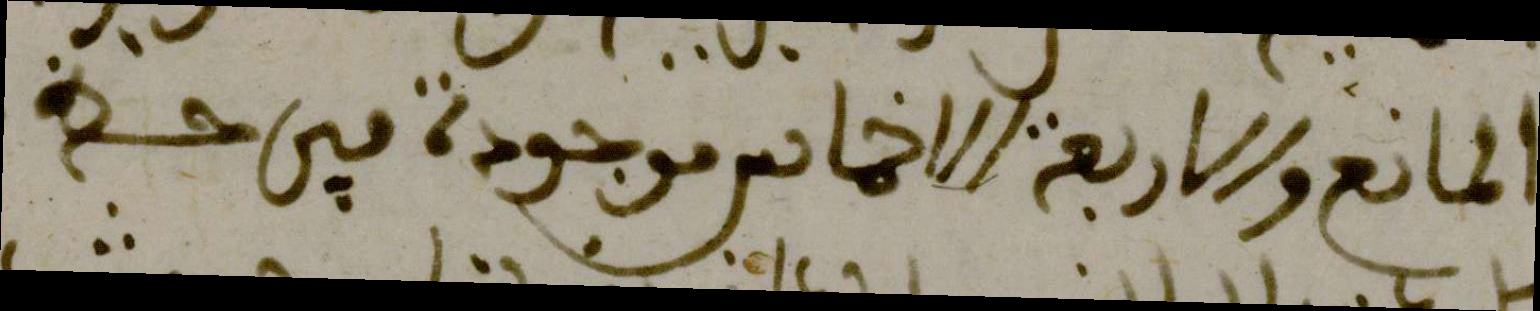المانع والاربعة الاخماس موجودة في حظ
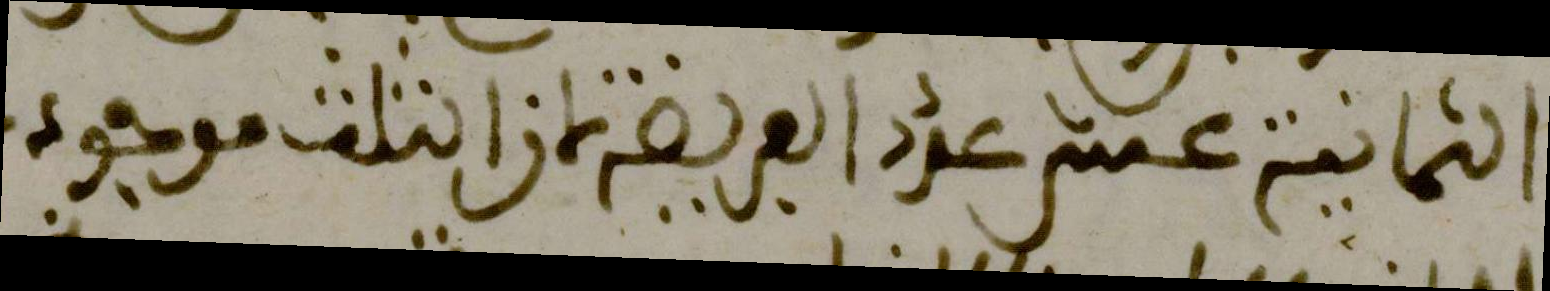الثمانية عشر عدد الفريضة لان الثلث موجود
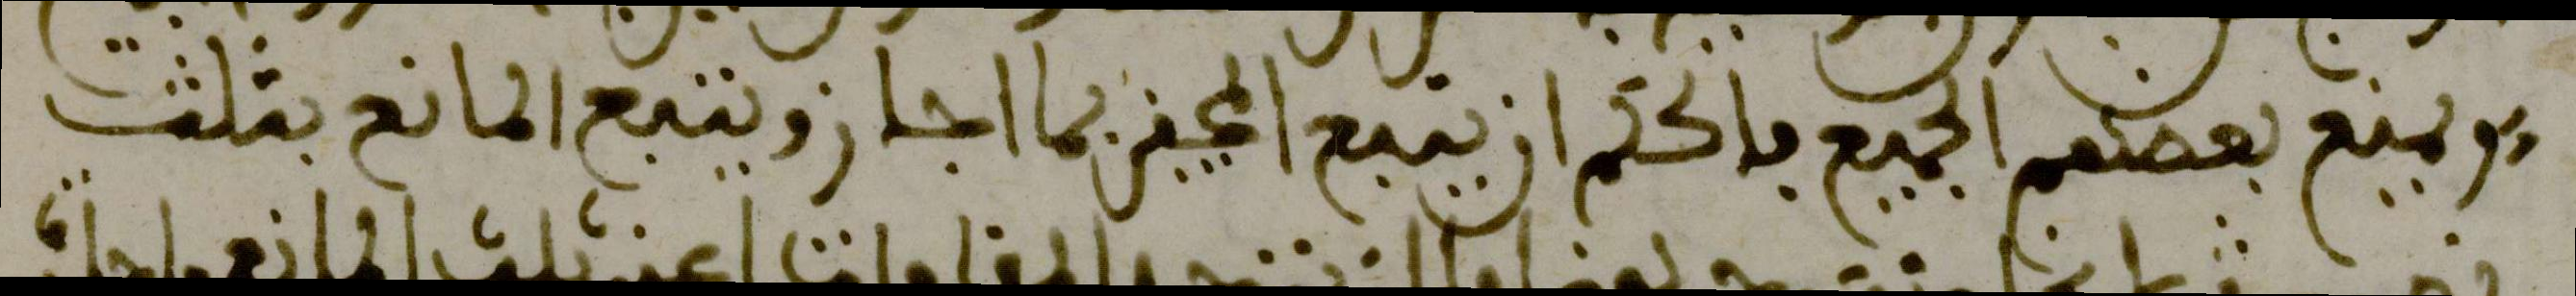ويمنع بعضهم الجميع فالحكم ان يتبع المجيز بما اجاز ويتبع المانع بثلث
